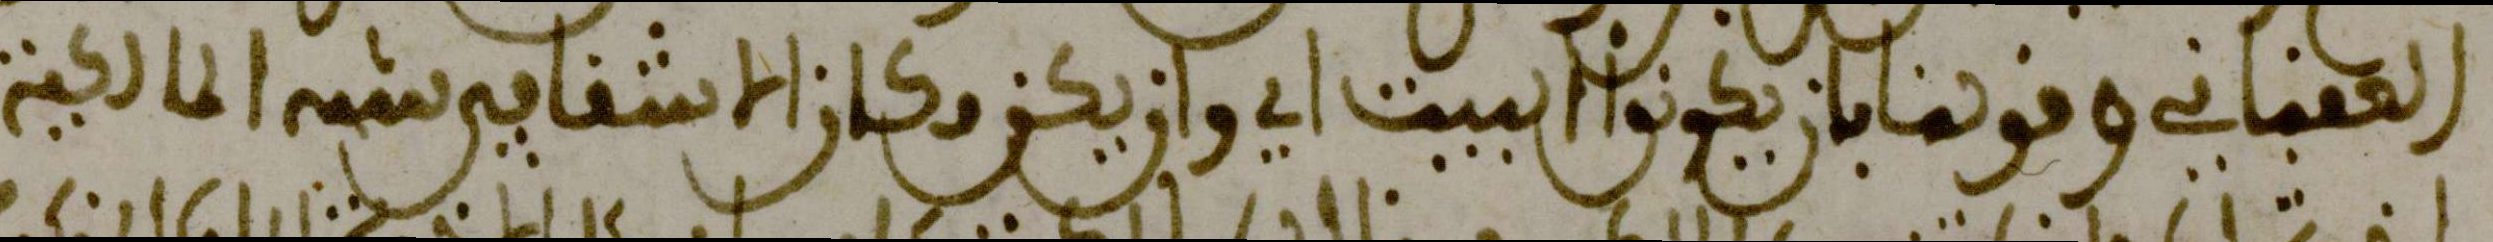العقباني وقولنا فان يكونوا البيت اي وان يكن مكان الاشقا في شبه المالكية
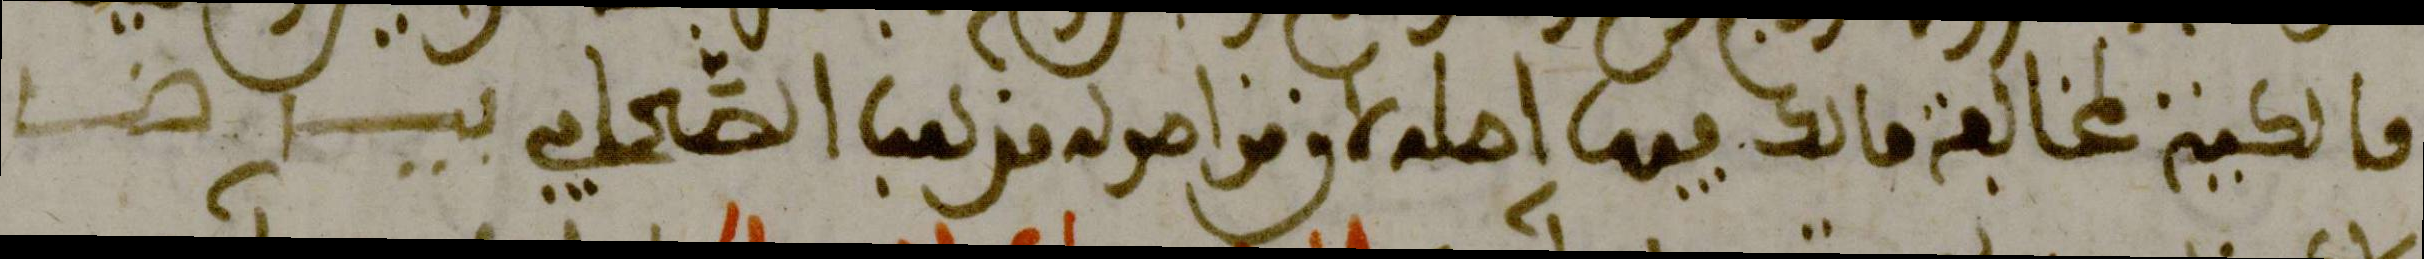مالكية لخالفة مالك فيها اصله لان من اصوله مذهب الصّحابي بي ضا
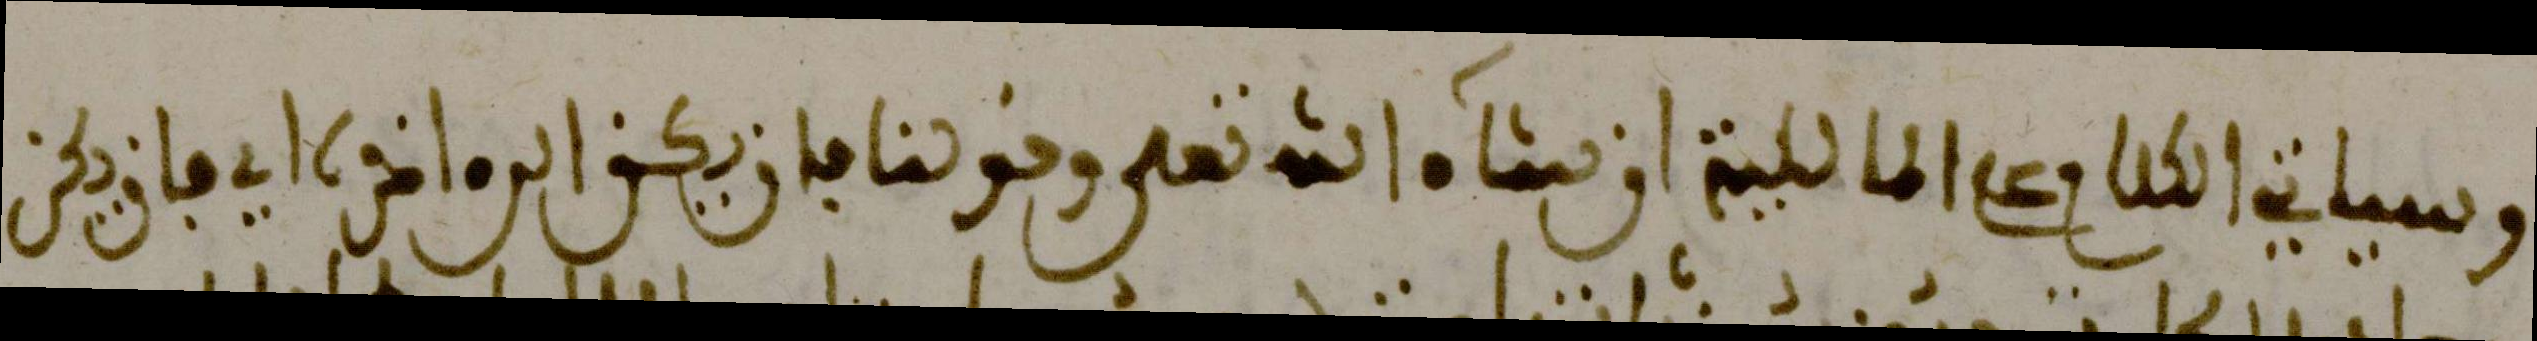وسياتي الكلام على المالكية ان شاء الله تعلى وقولنا فان يكن الى ءاخره اي فان يكن
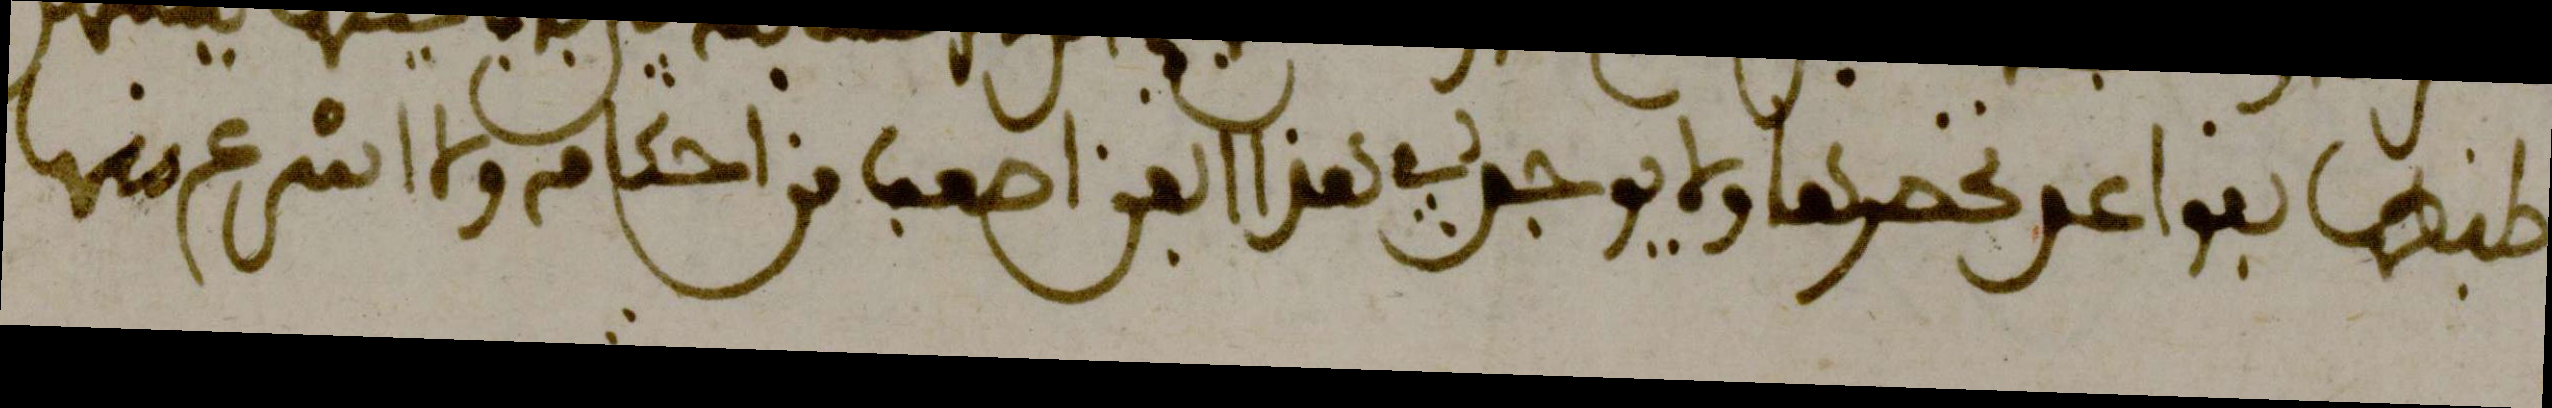ظبطها بقواعد تحصرها ولا يوجد في هذا الفن اصعب من احكامه ولا اسْرع منها
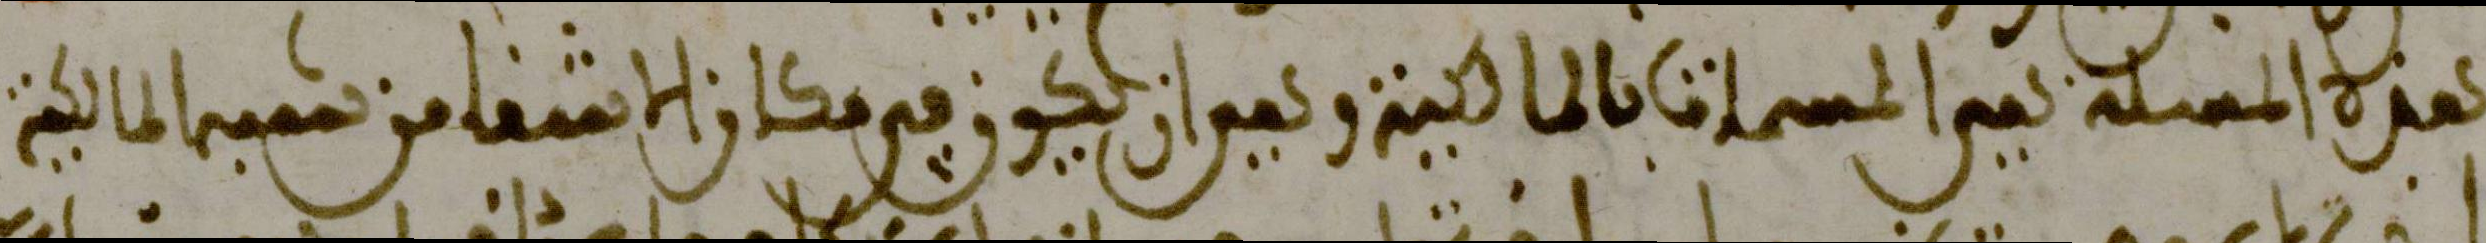هذه المسىلة هي المسمات بالمالكية وهي ان يكون في مكان الاشقا من شبه المالكية
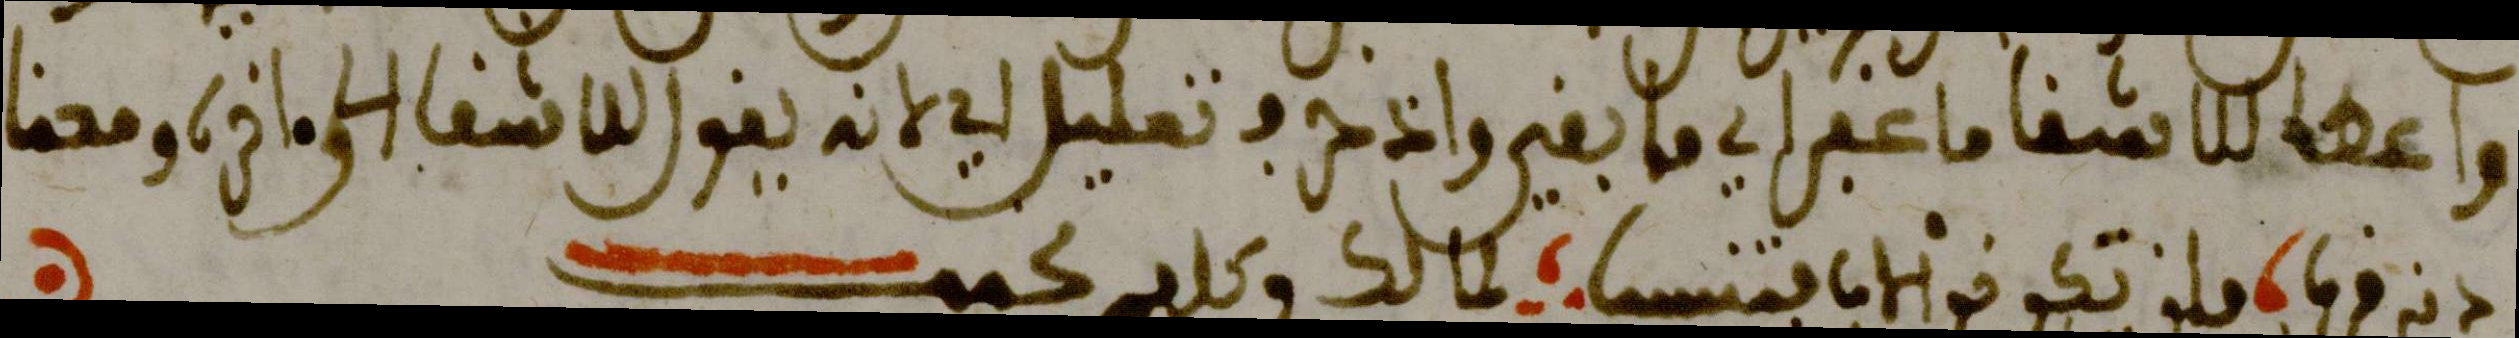واعطا للاشقا ما غبر اي ما بقي واذ حرف تعليل اي لانه يقول للاشقا الى ءاخره ومعنا
